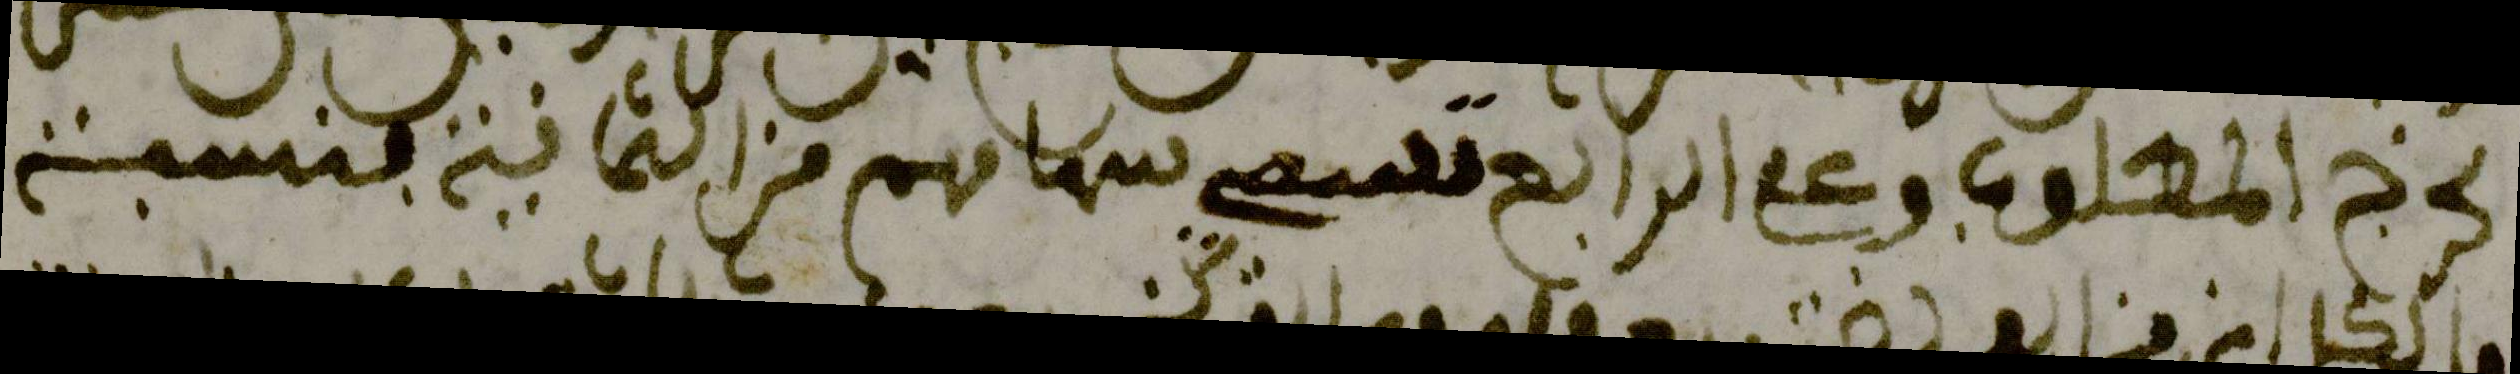يخرج المطلوب وعلى الرابع تسمى سهامهم من الثمانية فنسبة
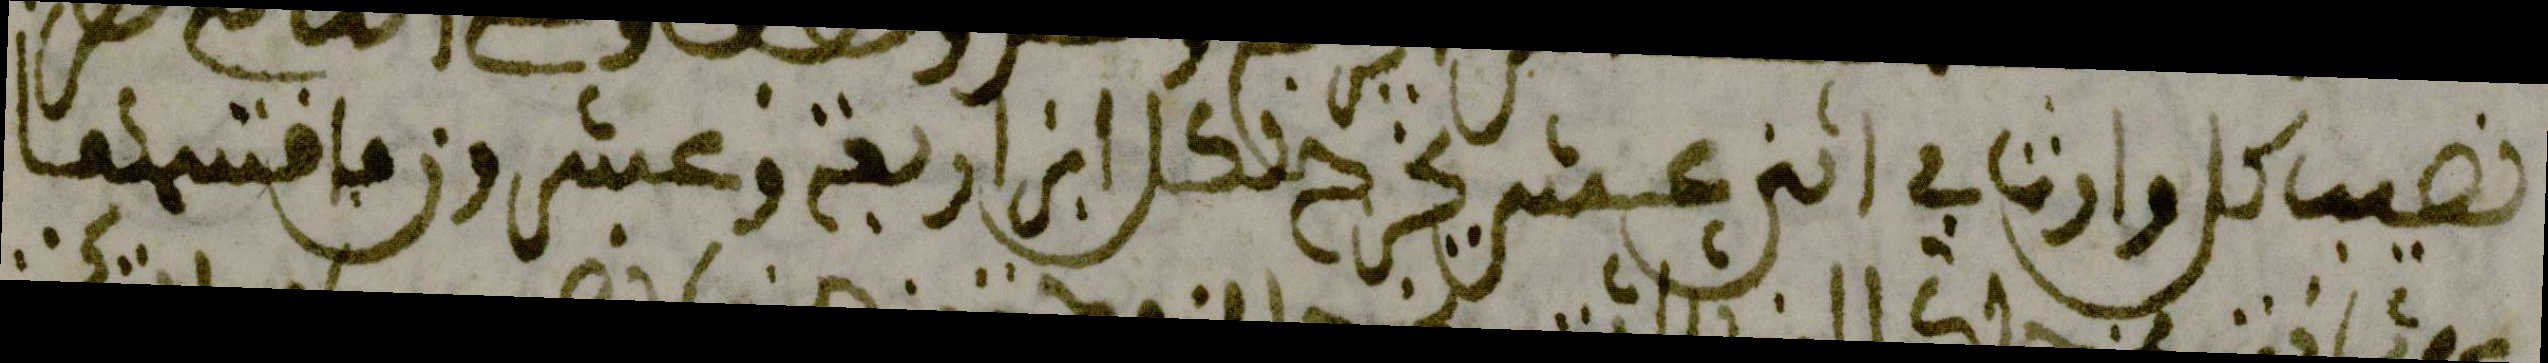نصيب كل وارث في اثنى عشر يخرج لكل ابن اربعة وعشرون فاقسمها
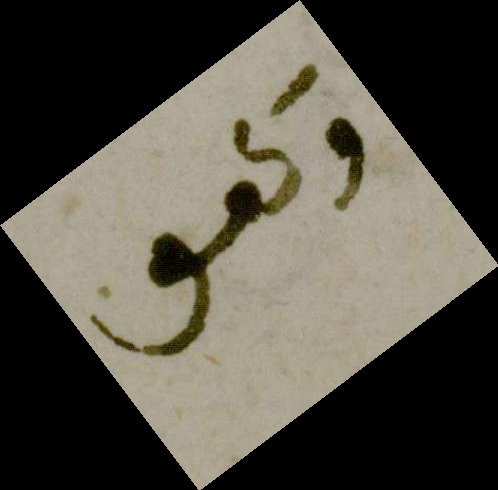وهو
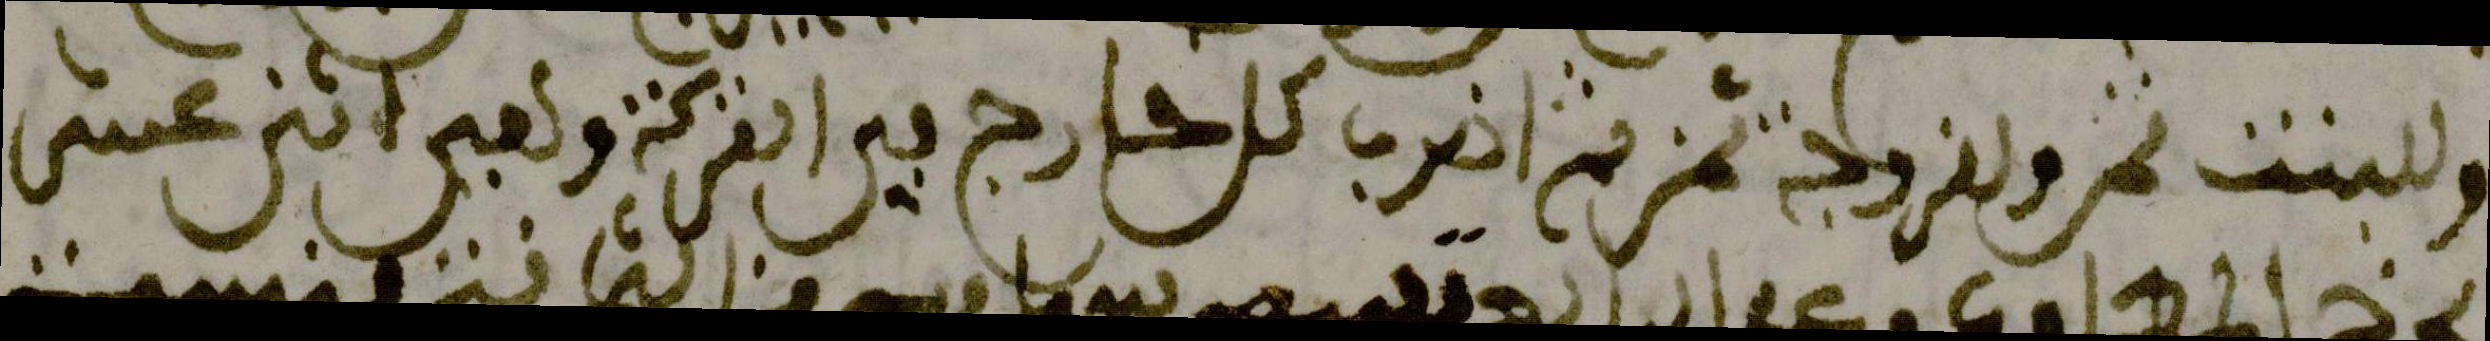وللبنت ثمن وللزوجة ثمن ثم اضرب كل خارج في التركة وهي اثنى عشر
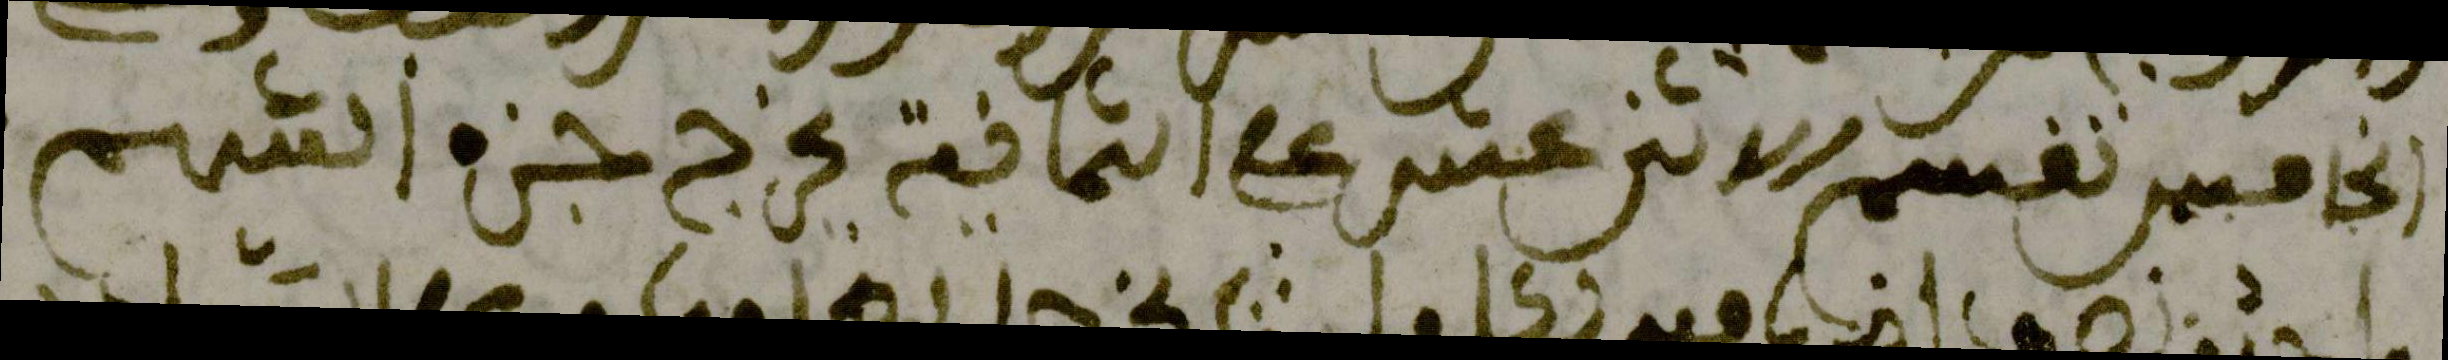الخامس تقسم الاثنى عشر على الثمانية يخرج جزء السّهم
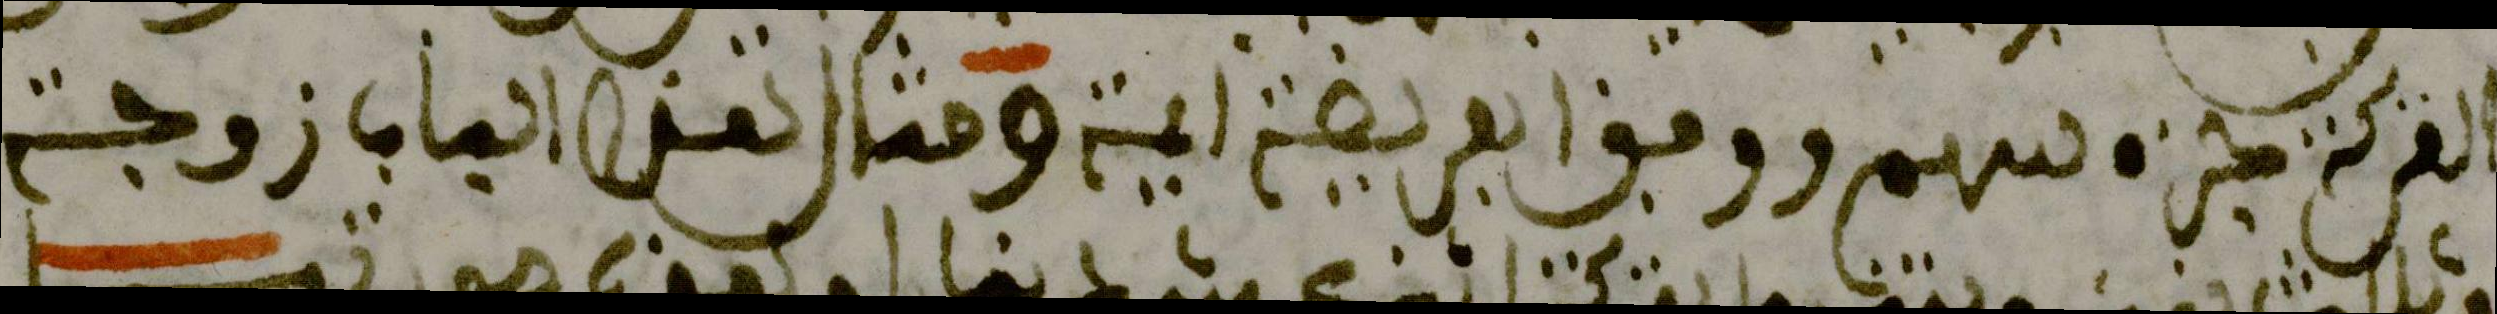التركة جزء سهم ووفق الفريضة ايمة وَمثال هذا الباب زوجة
